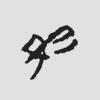利
